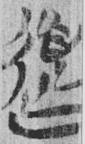道
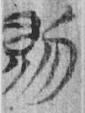則
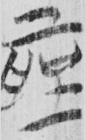聖
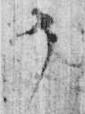人
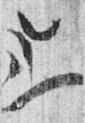之
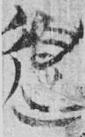道
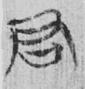君
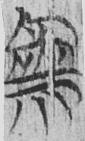齋
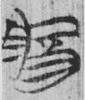𨟻（將）
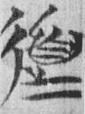道
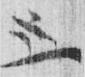之
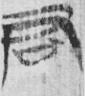君
